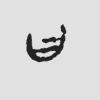曰
